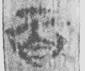百
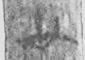卅
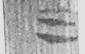三
